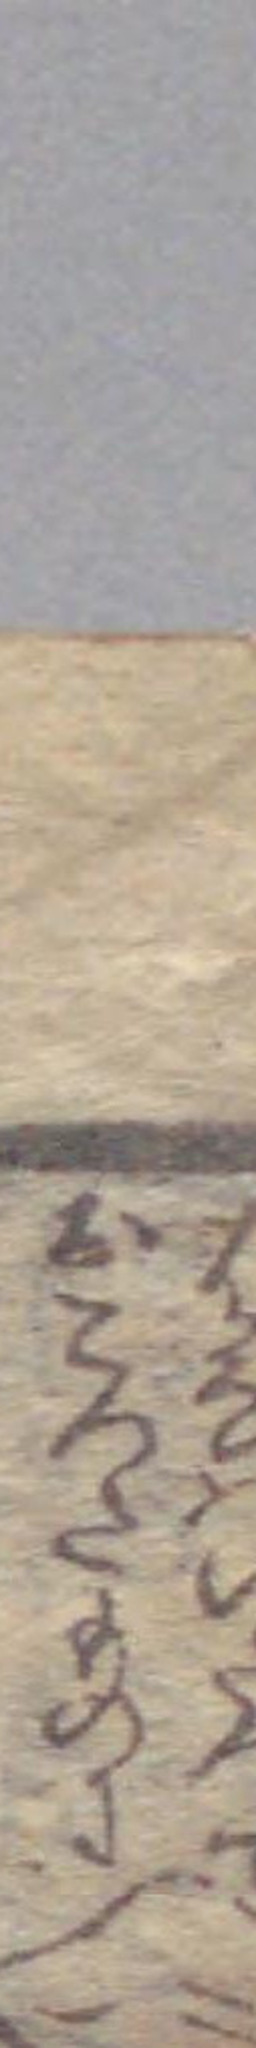おこつたものに
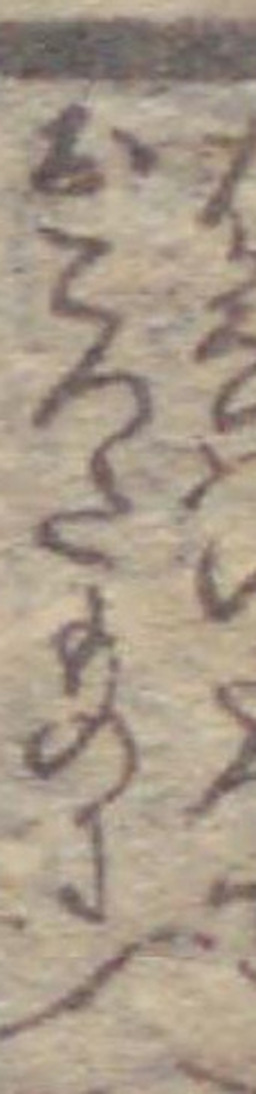おこつたものに
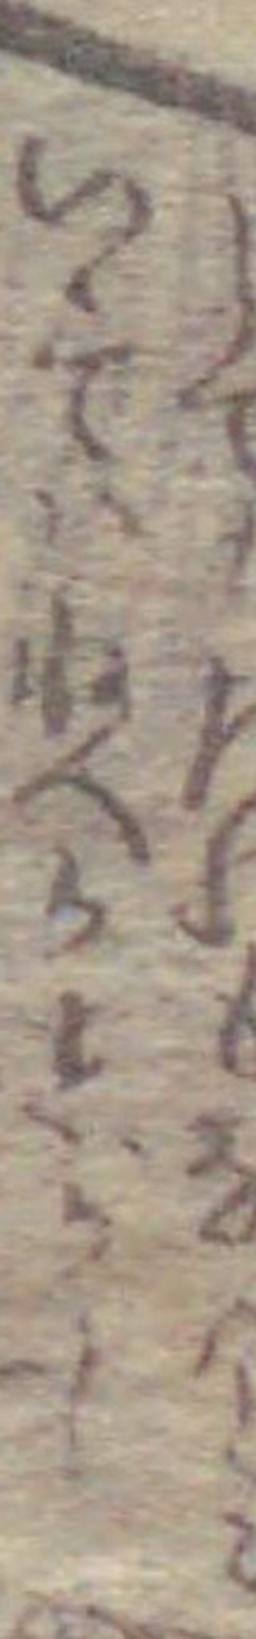いゝてはねへかしかし
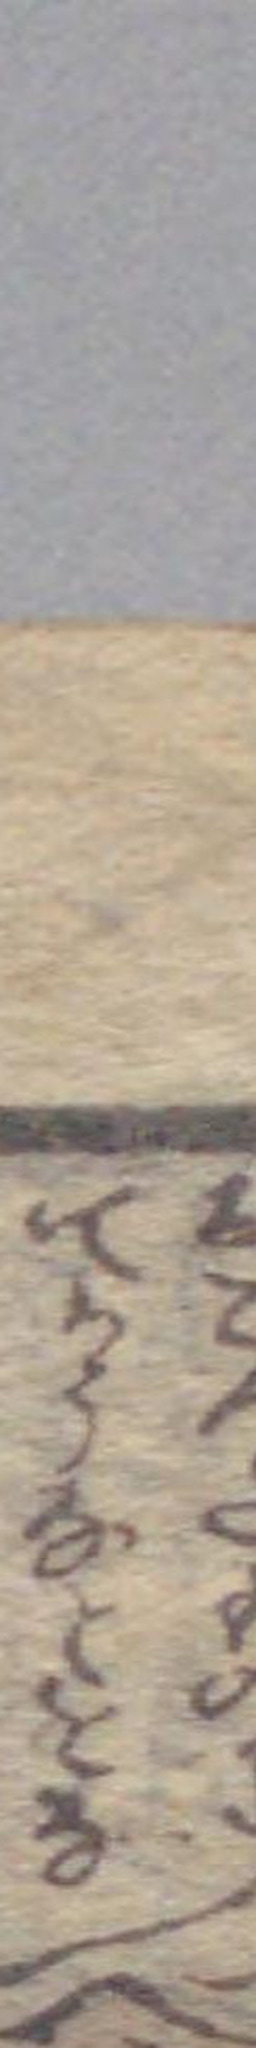てかうなとをな
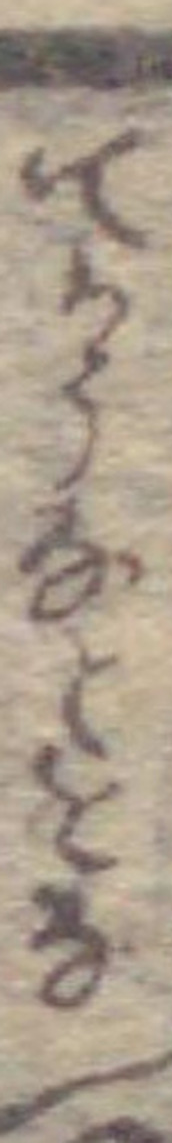てかうなとをな
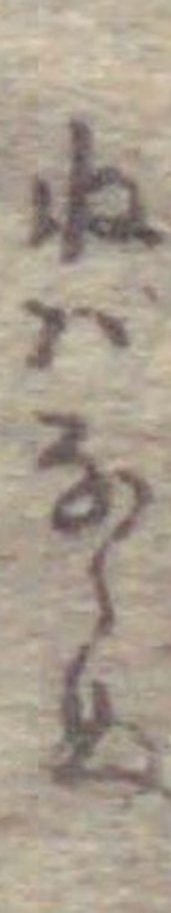ねはならぬ
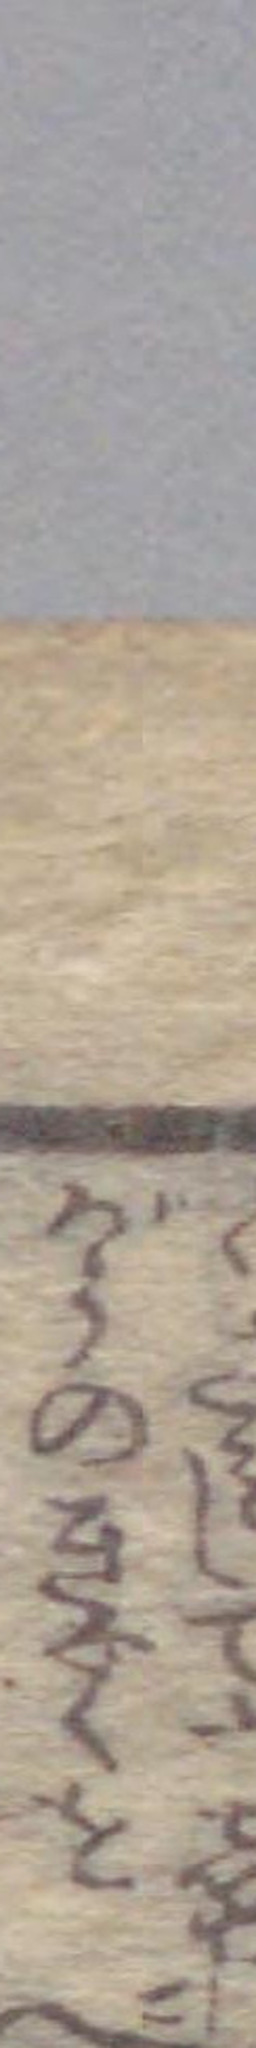ぼうのきふくを
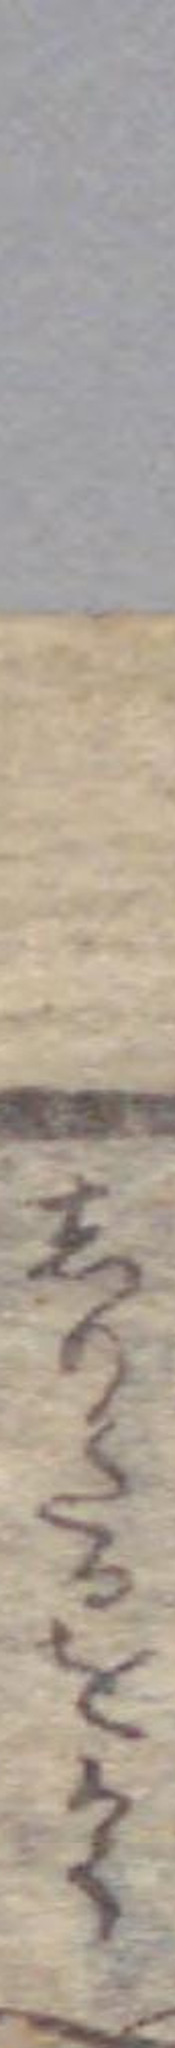しりたるをかう
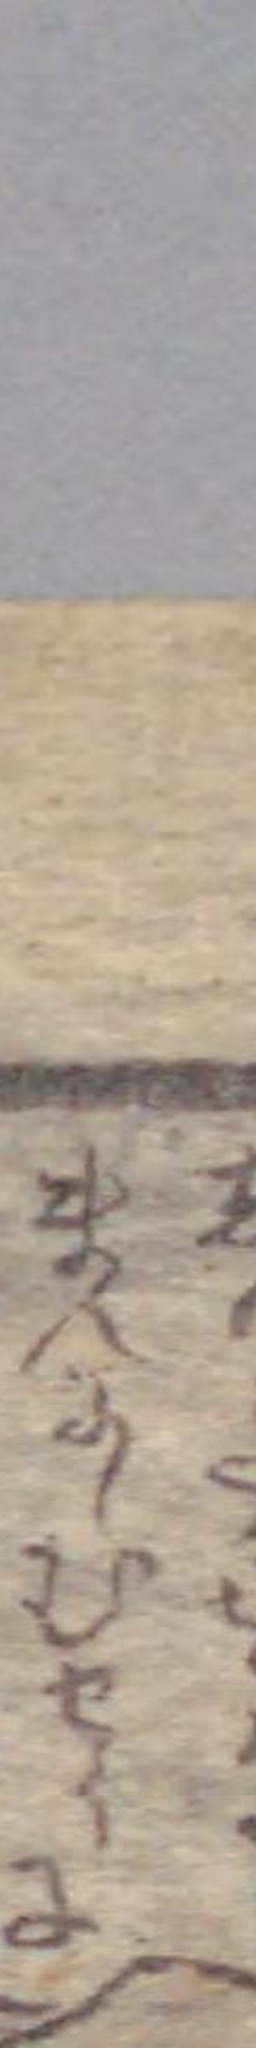まんにしむせうに
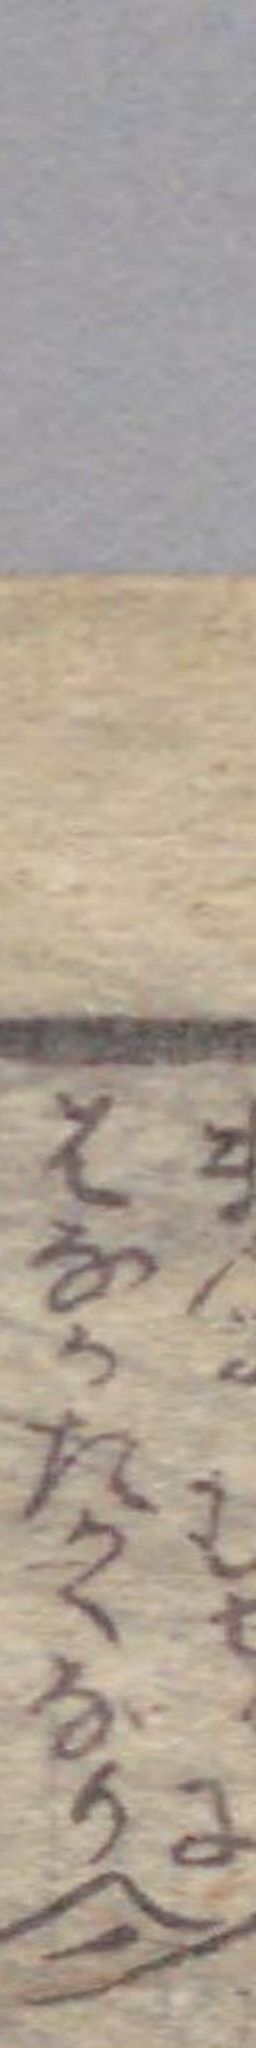はなかたかくなり
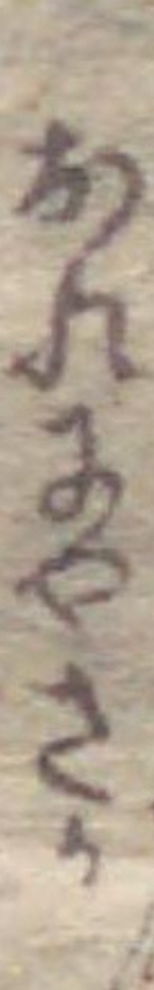おれにやさか
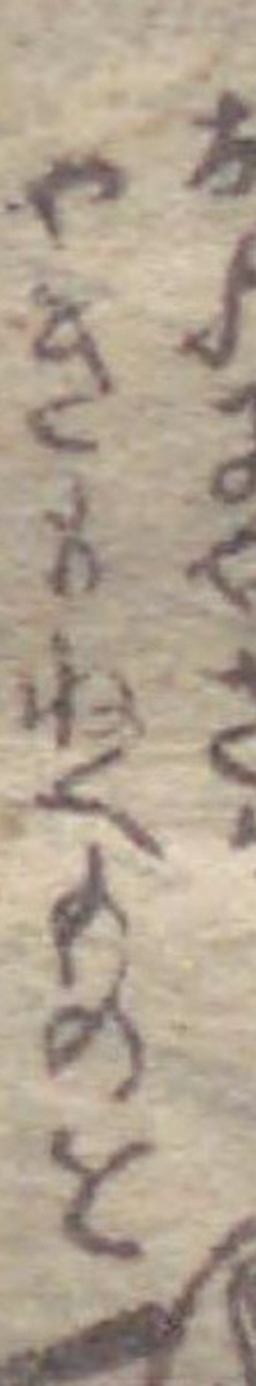やきもねへものを
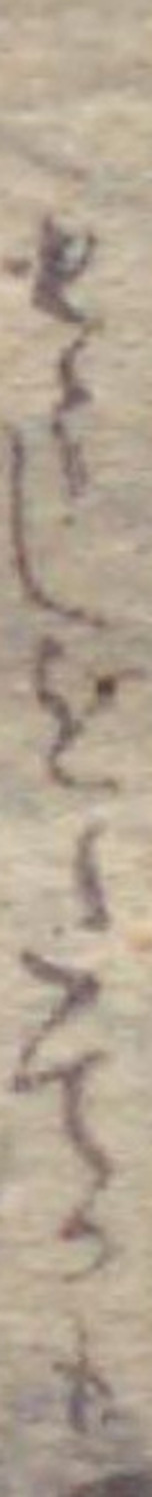せうしをたてるも
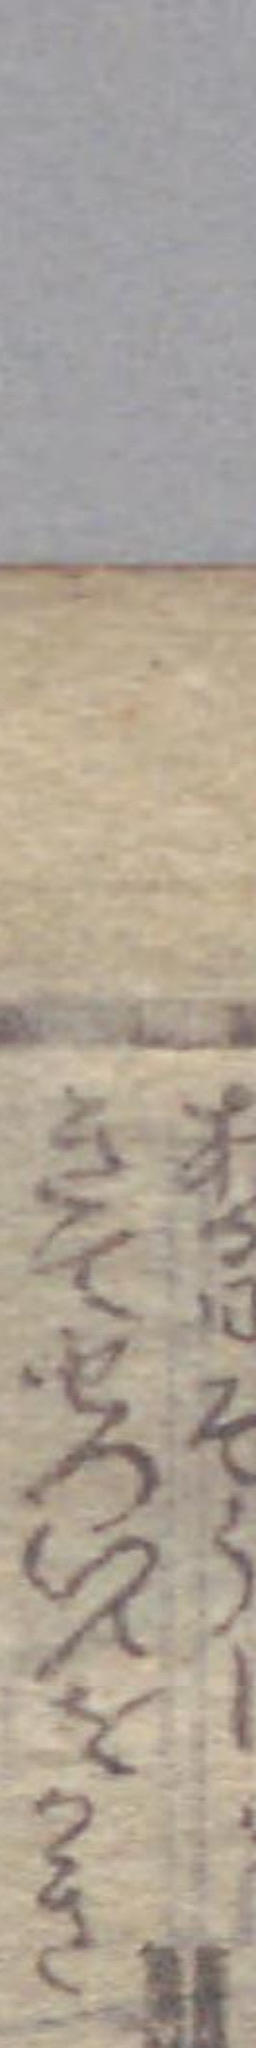きてせつちんをかき
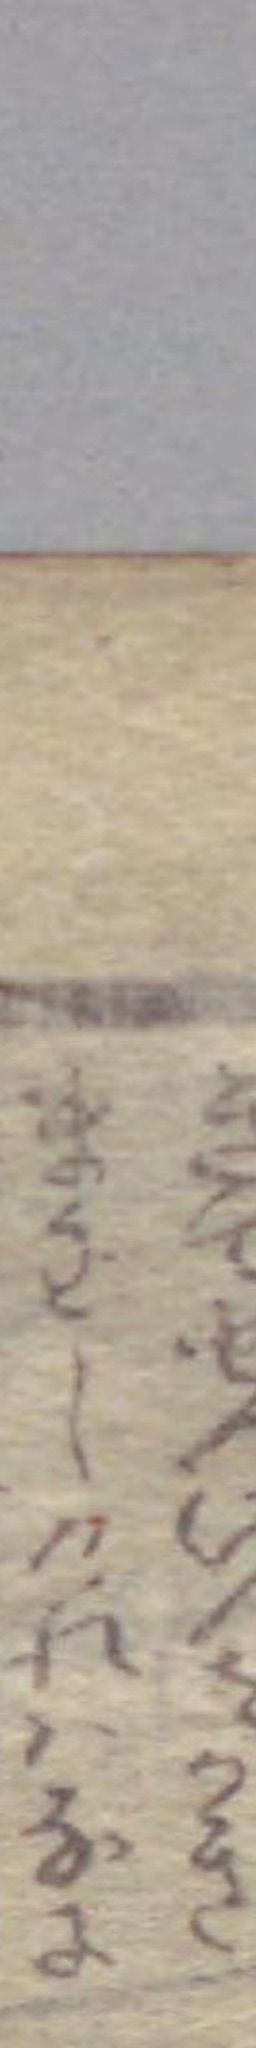まわしけれはなに
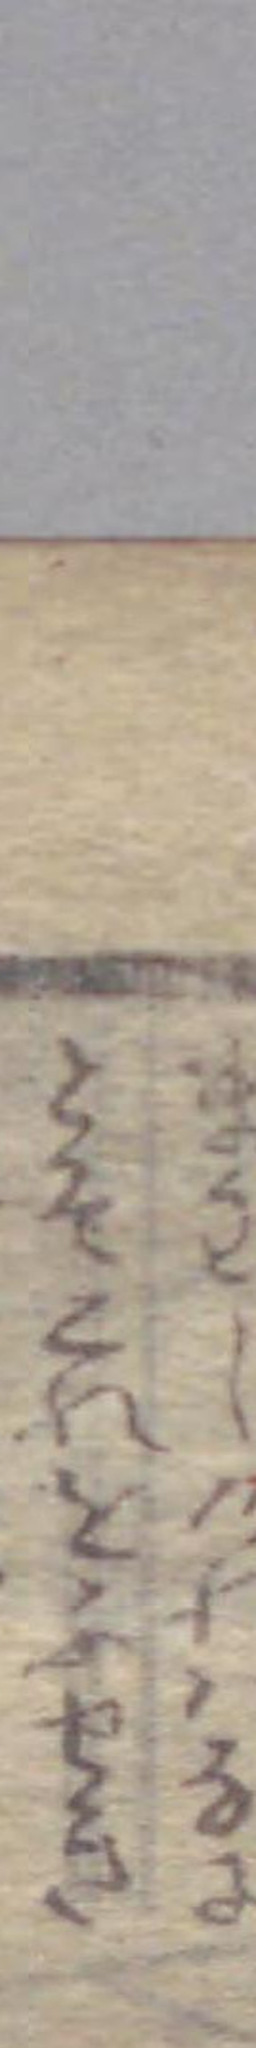とそこれをふせき
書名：五躰不具毒解薬 : 3巻
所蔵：国立国会図書館 National Diet Library, JAPAN
